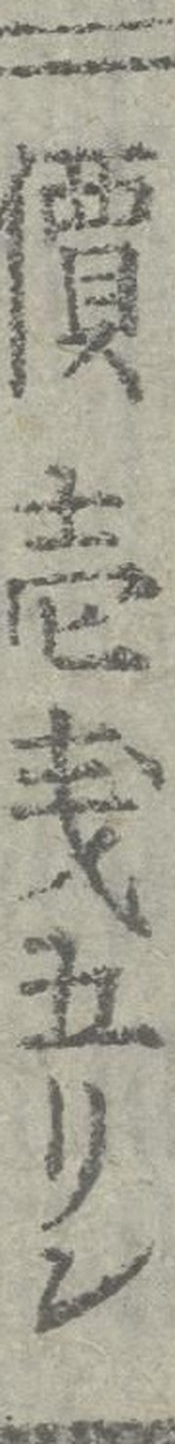価壱銭五リン
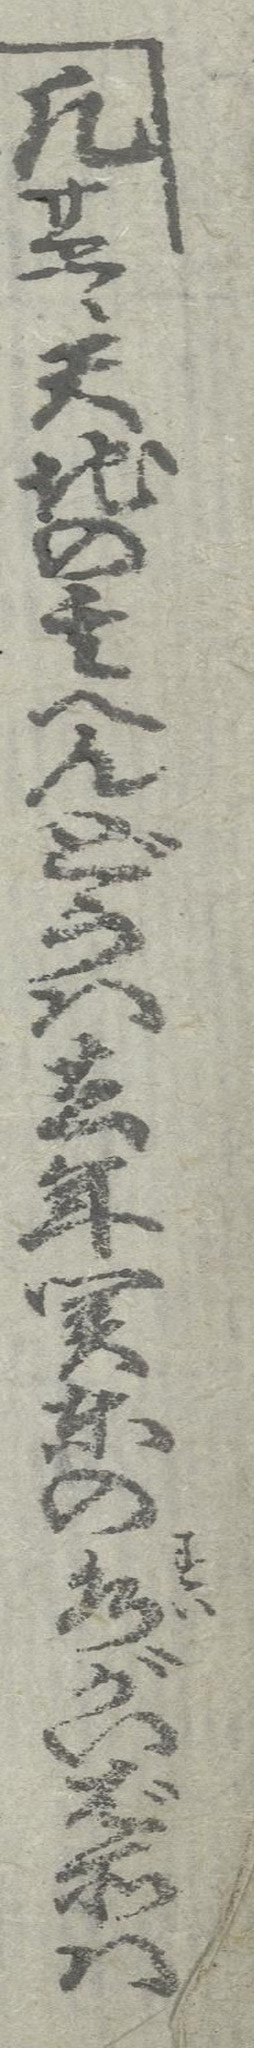〽凡サヱヽ天地の其へんどうは去年関東の水がいば所は
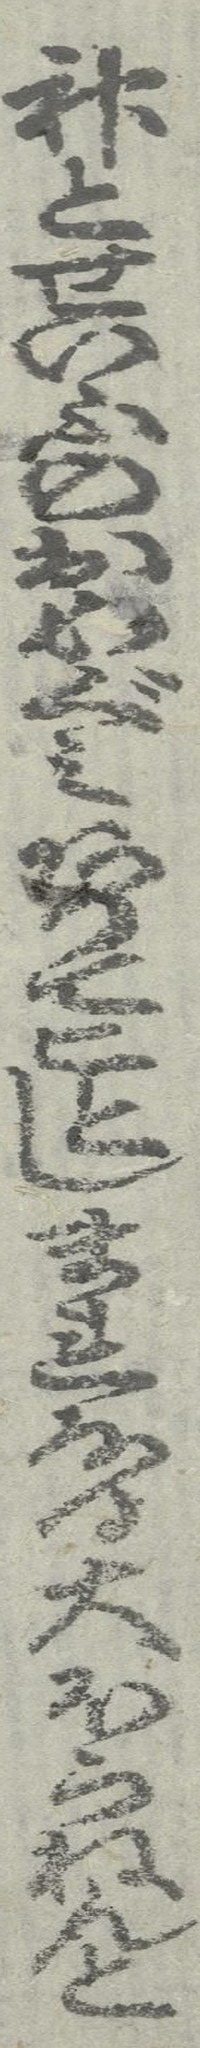神とせいふのおめぐみありてことしまれなる大ほらねんと
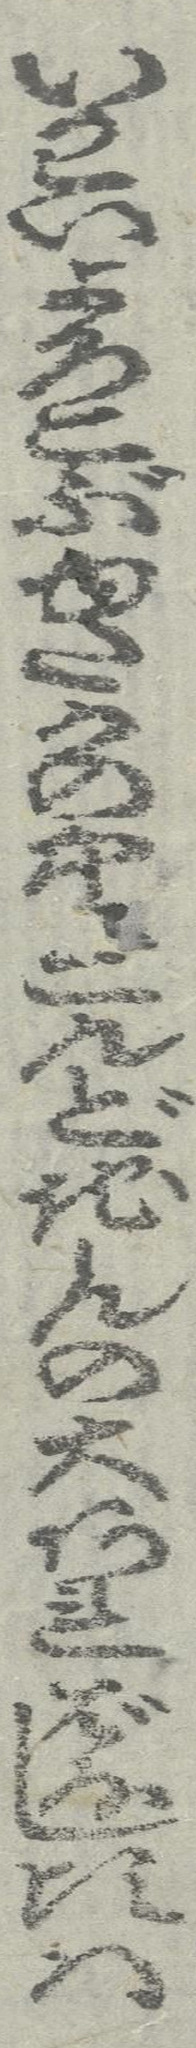いわいよろこぶゆたかの中ニこんど地しんの大あればなし頃は
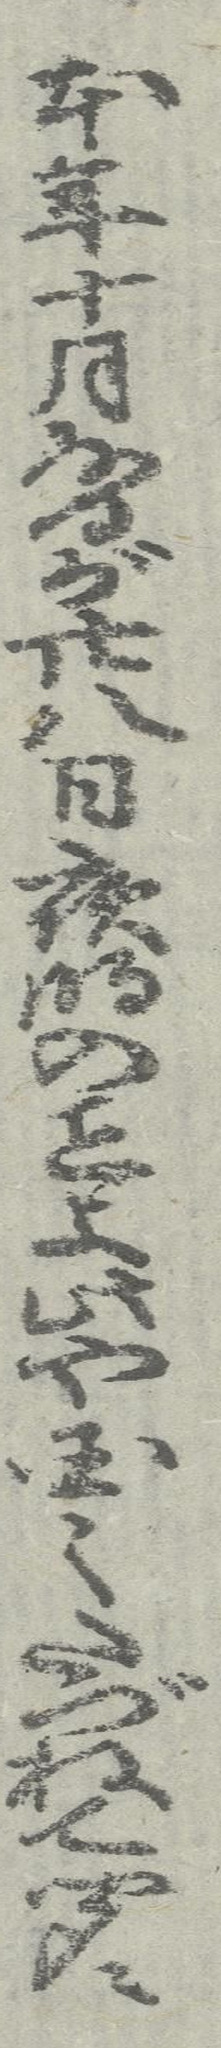本年十月なるが廿八日夜明のことよ此や国々たづねて聞ニ
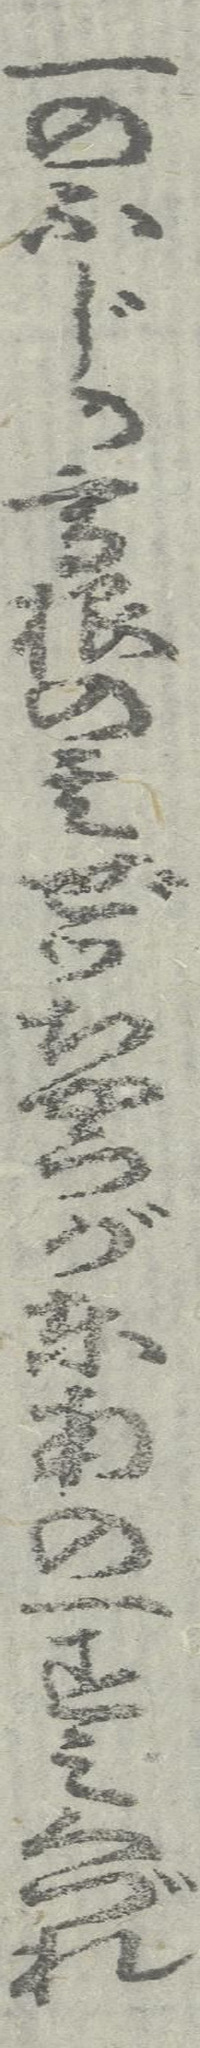一のふじの高根の其ぜツちやうが東南の一すみくづれ

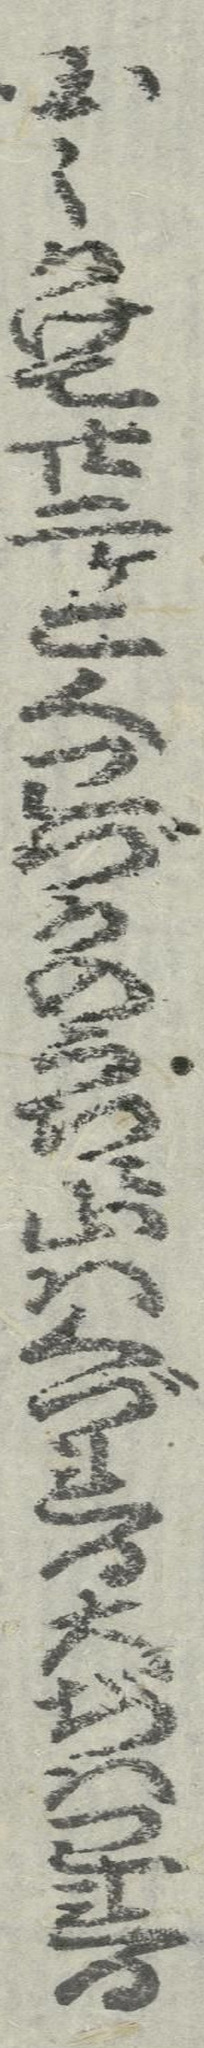国々かけて廿二ヶこくわづかのうちニ山はくづれる大ぢはわれる
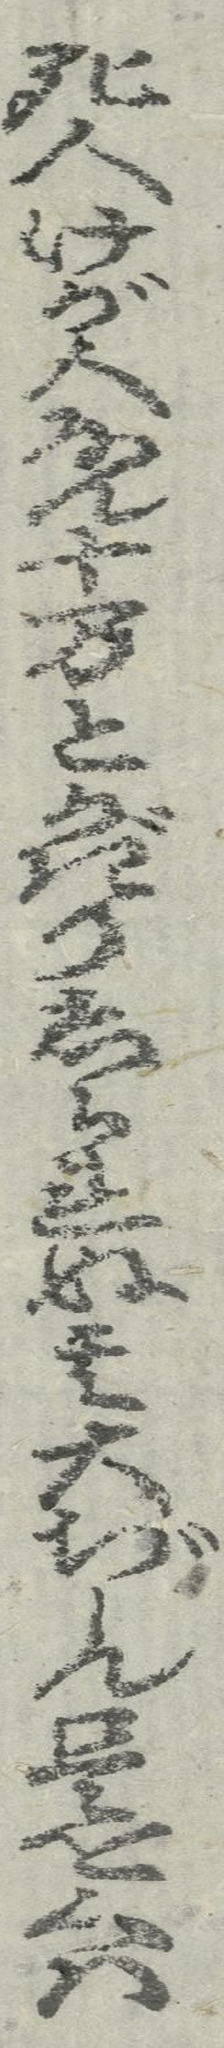死人けが人なん十万とかぎりしられぬ其大ぢしん是をくは
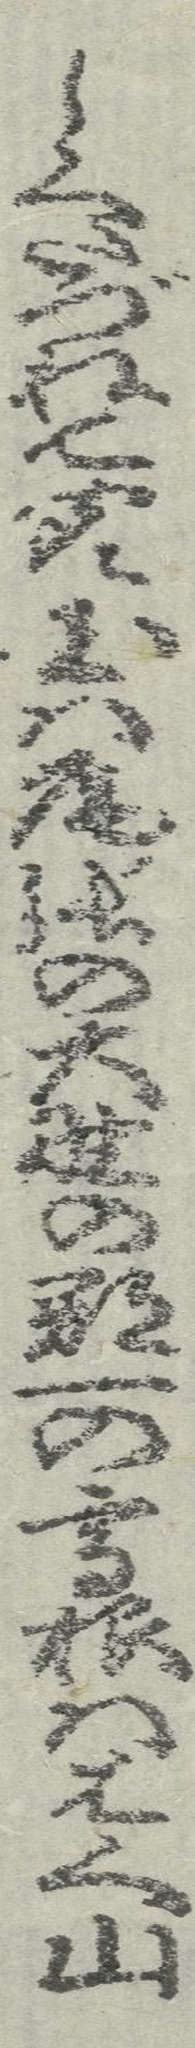しくたづねて聞ニ国は尾張の大野の郡一の高根ははく山
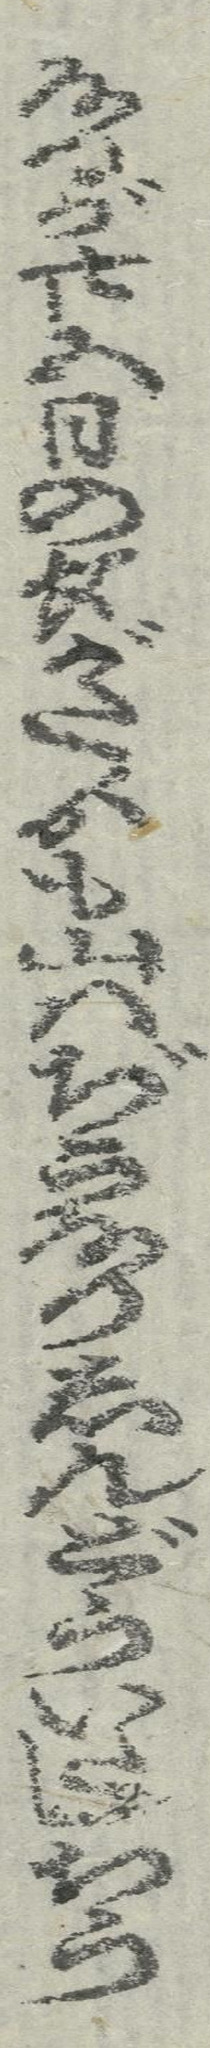なるが廿五日の夕がたゟも山はぢうなりしんどういたしちう
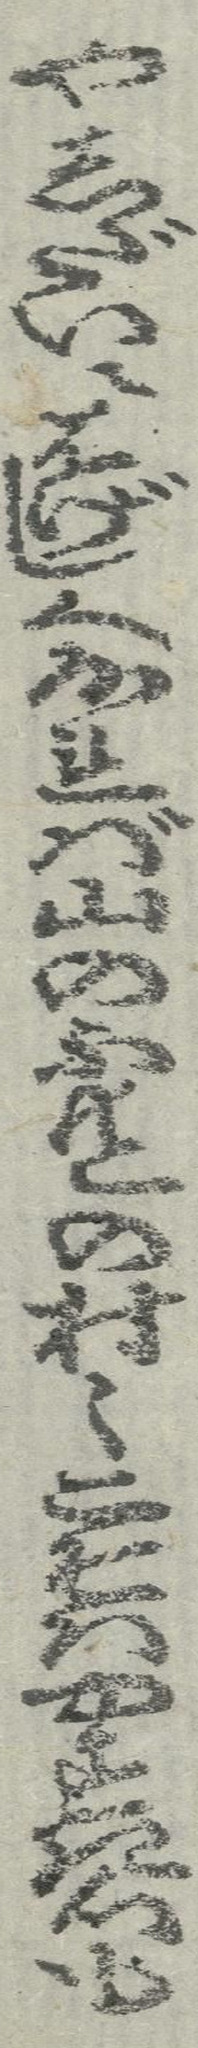やしだいニはげしくなれば山のふもとの村々こそは安き心も
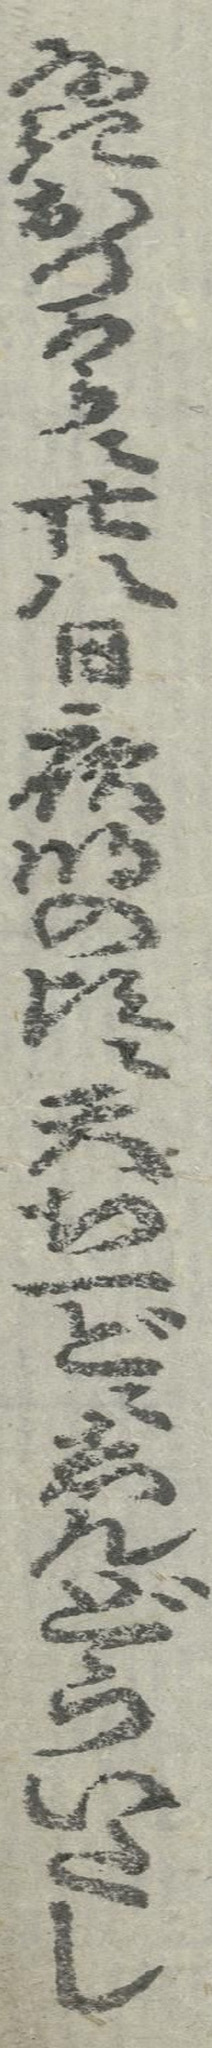なきおりからニ廿八日夜明の頃ニ天ち一どニしんどういたし
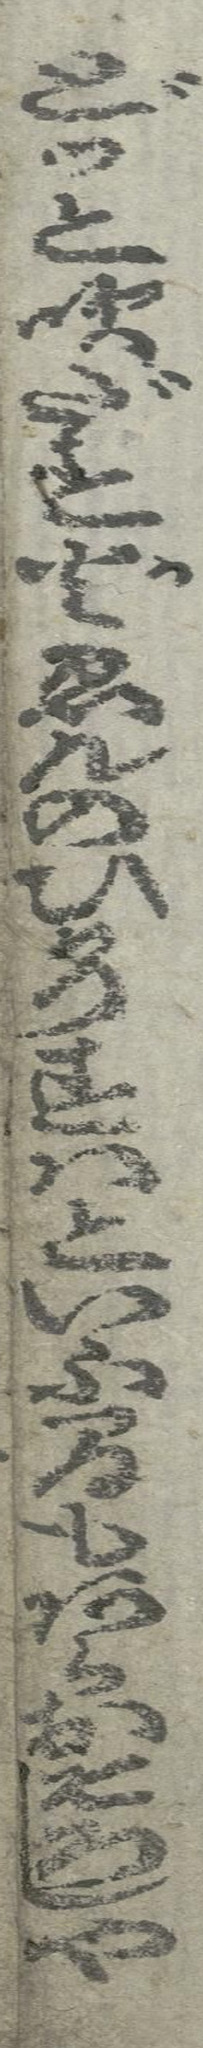どツと吹だす火ゑんのひかりすはといふ間もあらおそろしや
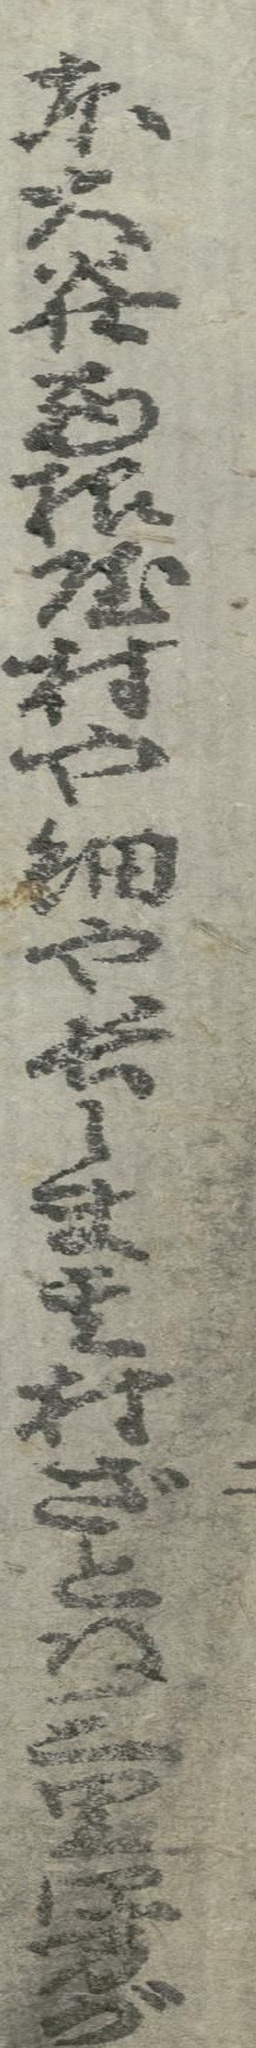東大谷西根屋村や細や長しま其村ざとは三里四方が
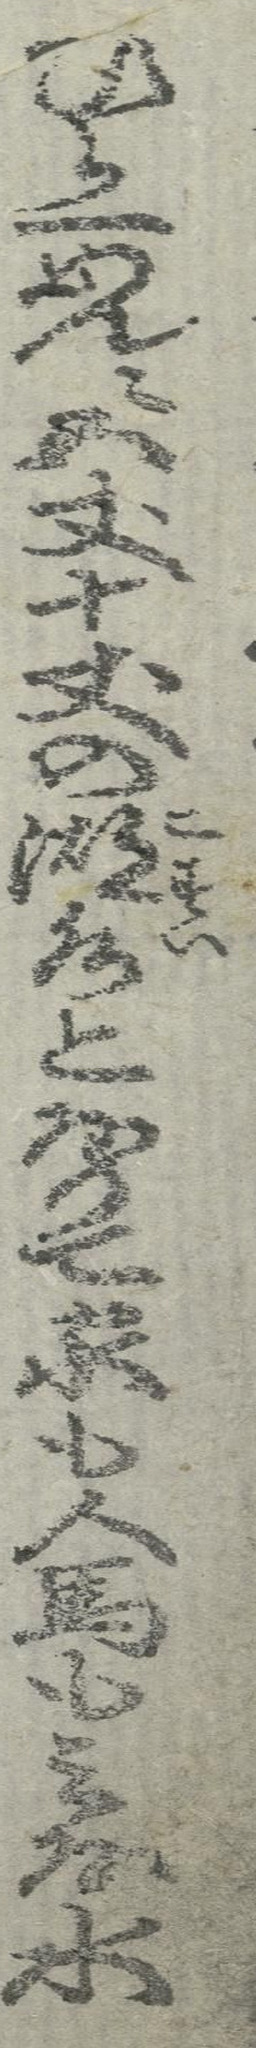ひら一めんニ五丈十丈の湖水となりて家も人馬もみな水
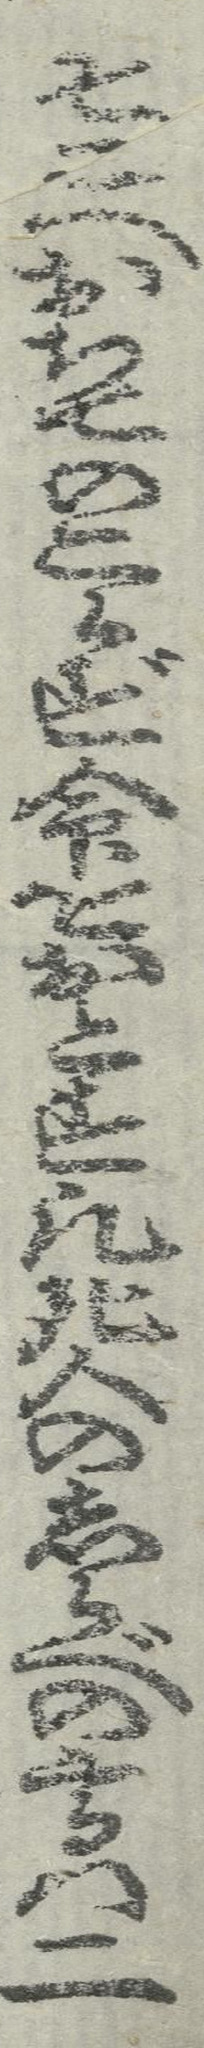そこへおちてのこらず命をおとす凡死人のしらべの高は二
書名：十二ヶ国大地しんくどき
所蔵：東京大学地震研究所図書室 Earthquake Research Institute Library, The University of Tokyo, JAPAN
